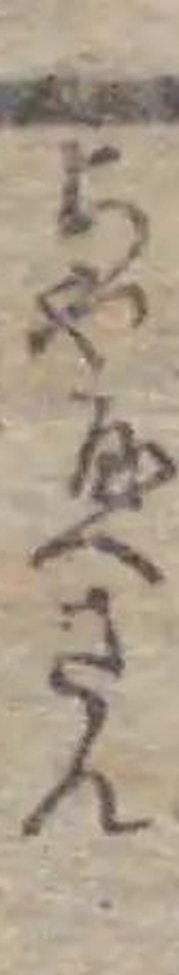ちや屋へさん
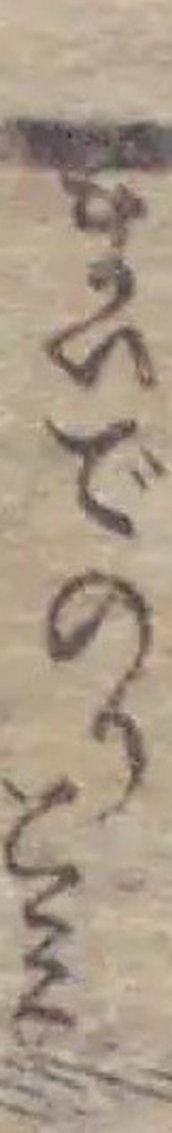まいでのりこみ
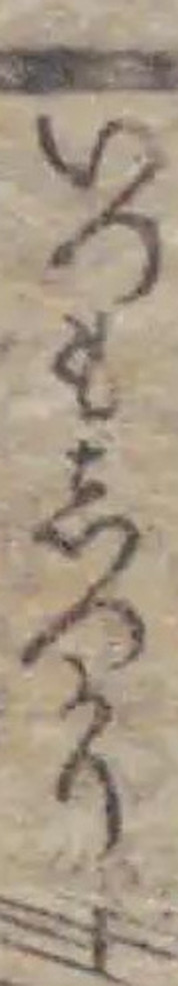いつもちつかり
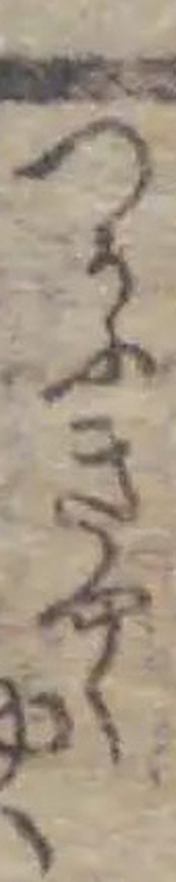つかふきやくゆへ
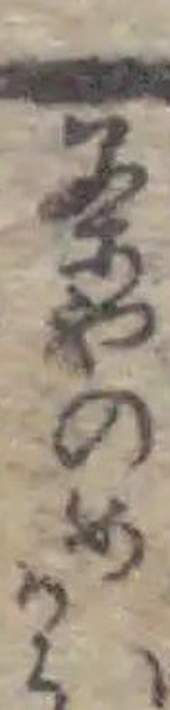茶やのめからは
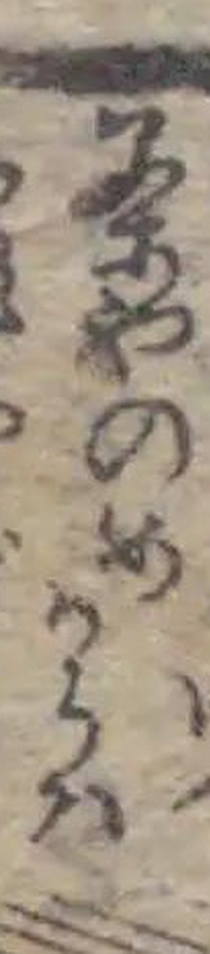茶やのめからは
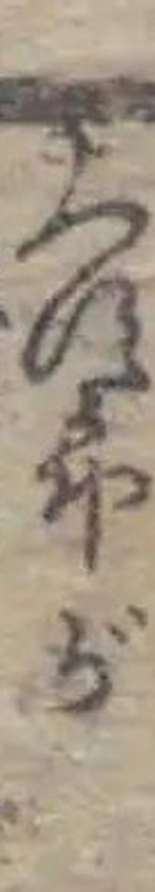大次郎が
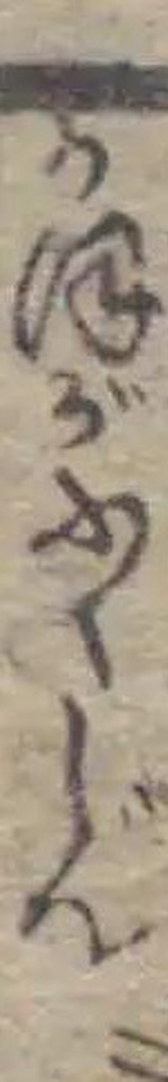かほがふくじん
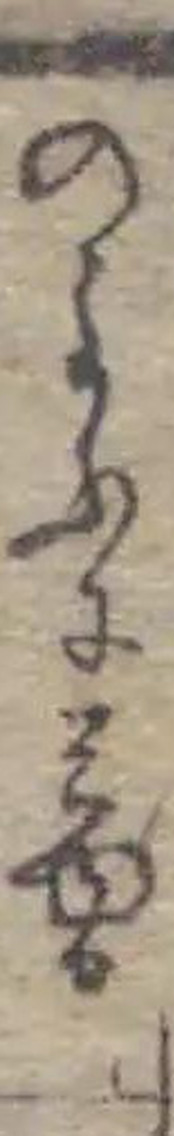のよふにみゆる
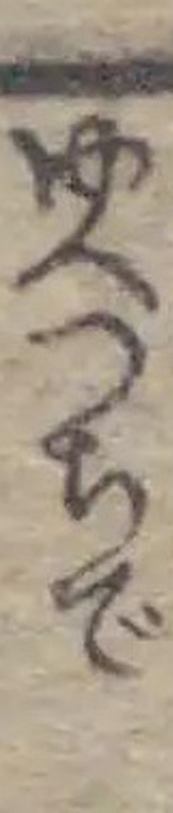ゆへつちで
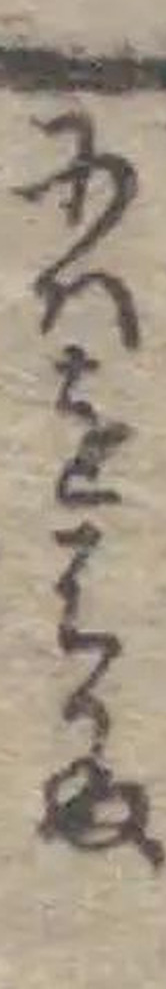にはをはかぬ
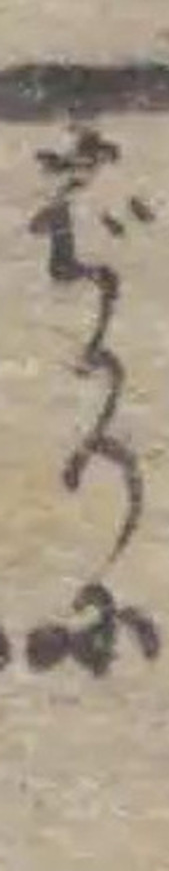ばかりに
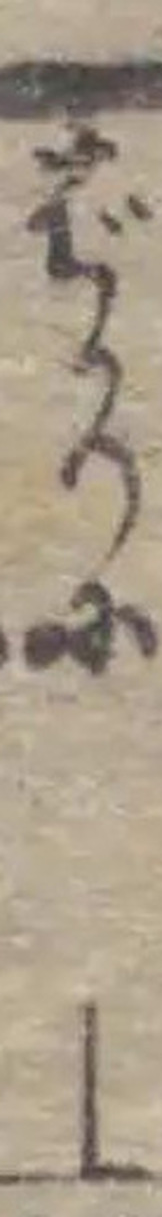ばかりに
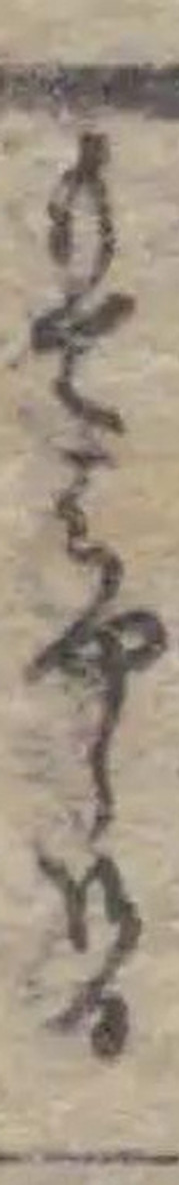もてはやしける
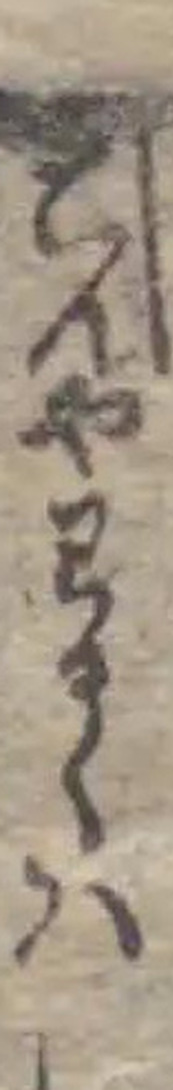〽こんやわるくは
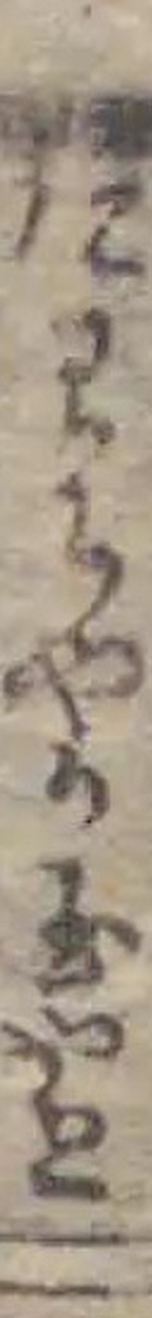たわらやか玉やと
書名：福壽海旡量品玉 3巻
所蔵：国立国会図書館 National Diet Library, JAPAN
